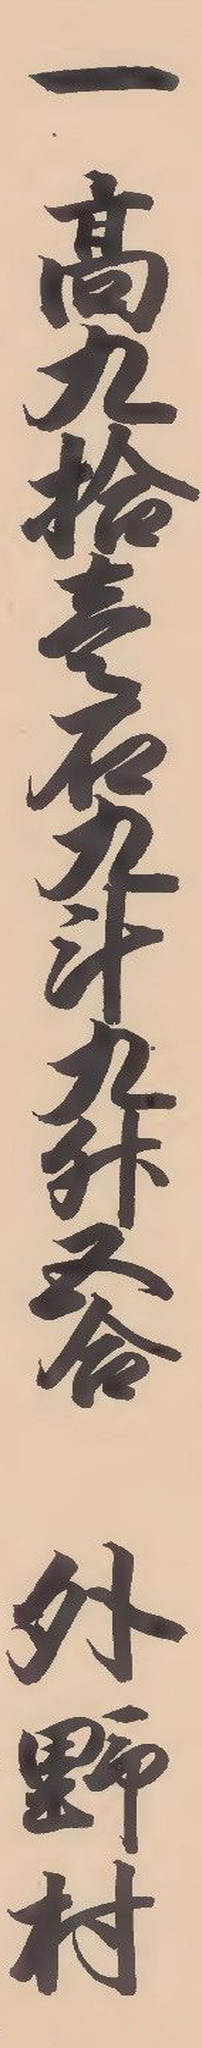一高九拾壱石九斗九升五合外野村
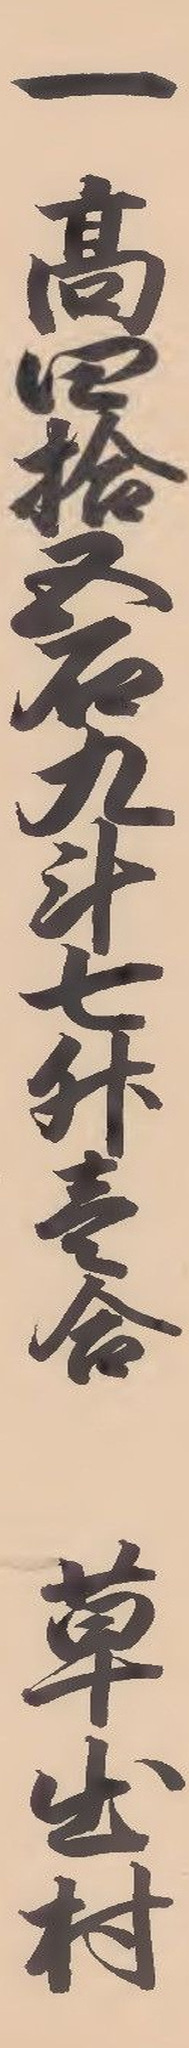一高四拾五石九斗七升壱合草出村
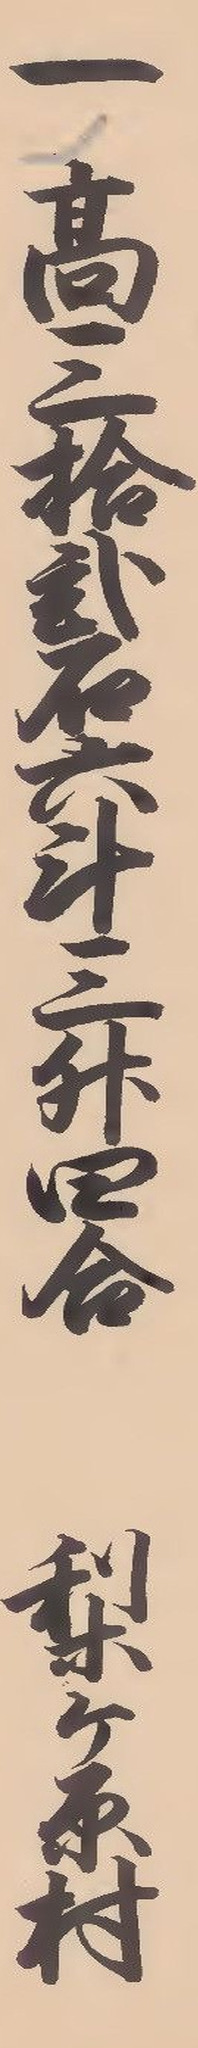一高三拾弐石六斗三升四合梨ケ原村

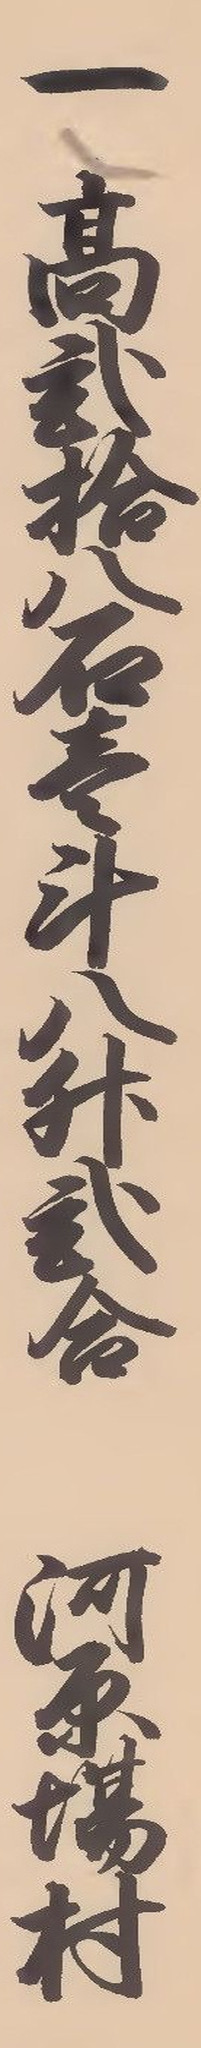一高弐拾八石壱斗八升弐合河原場村
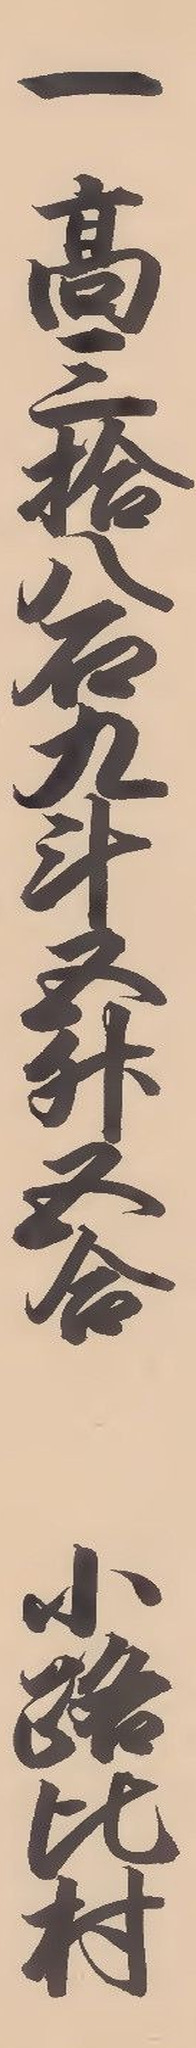一高三拾八石九斗五升五合小路比村
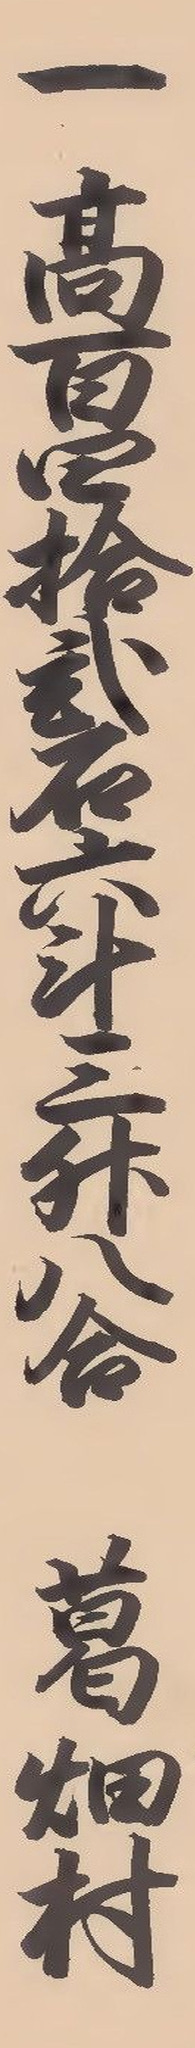一高百四拾弐石六斗三升八合葛畑村
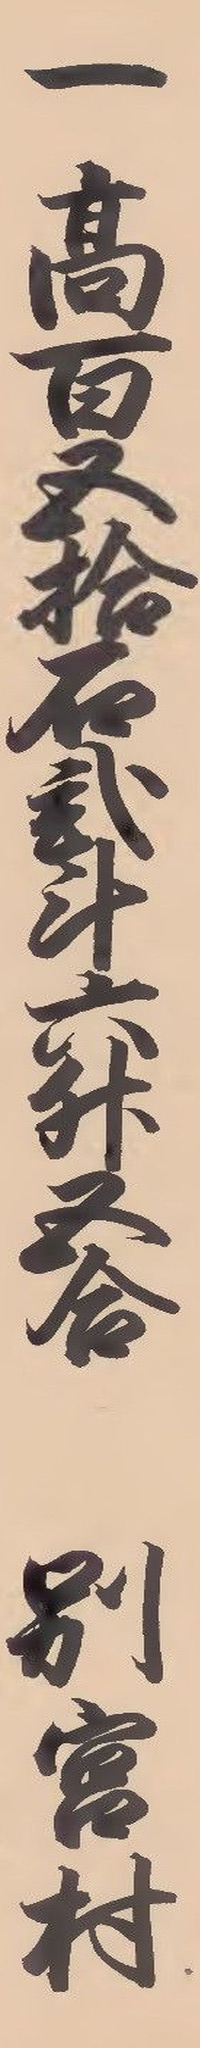一高百五拾石弐斗六升五合別宮村
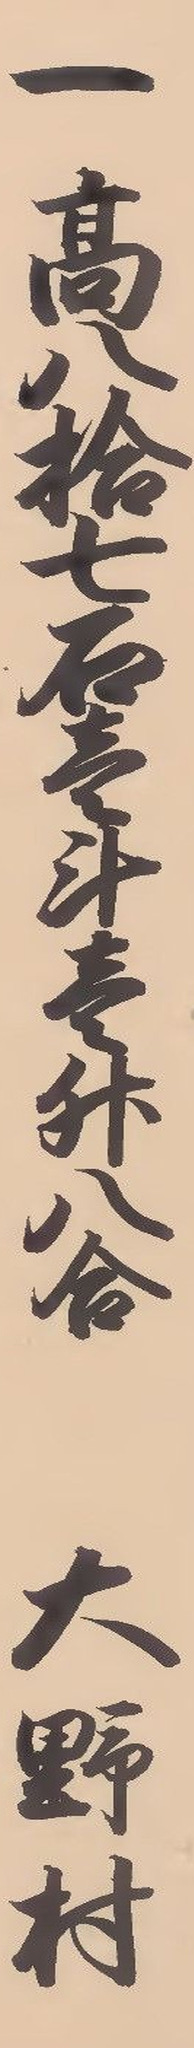一高八拾七石壱斗壱升八合大野村
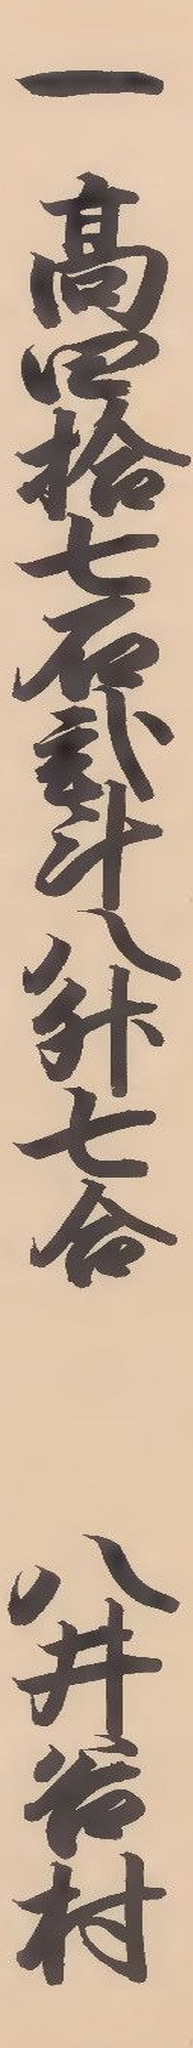一高四拾七石弐斗八升七合八井谷村
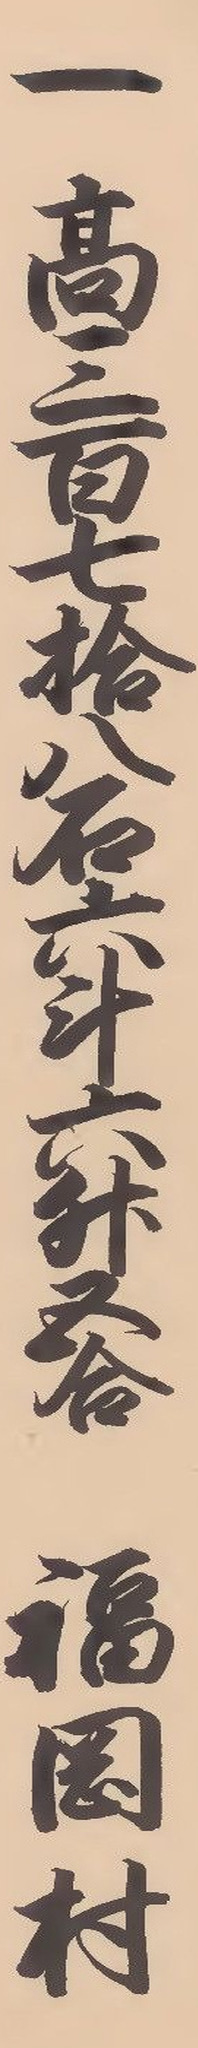一高三百七拾八石六斗六升五合福岡村
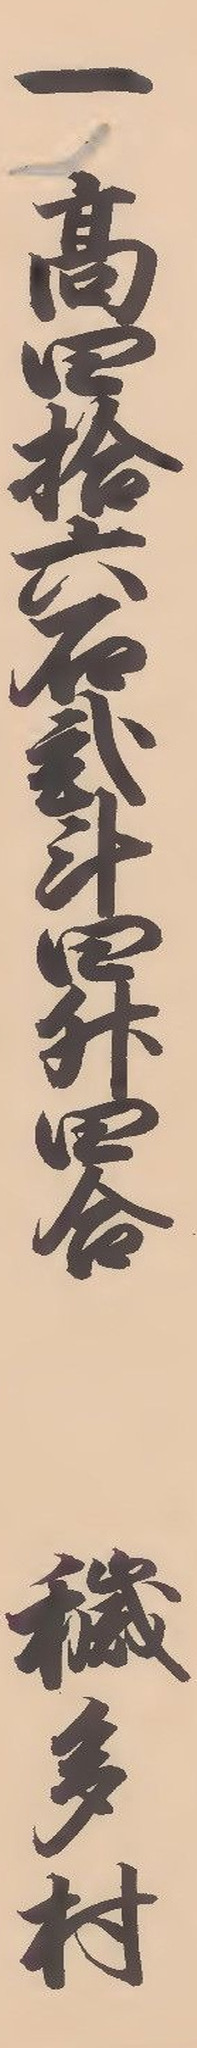一高四拾六石弐斗四升四合穢多村

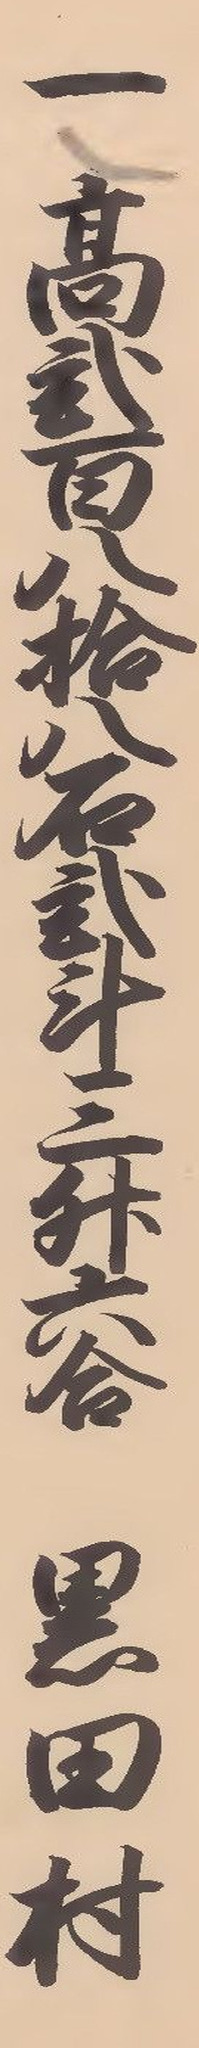一高弐百八拾八石弐斗三升六合黒田村
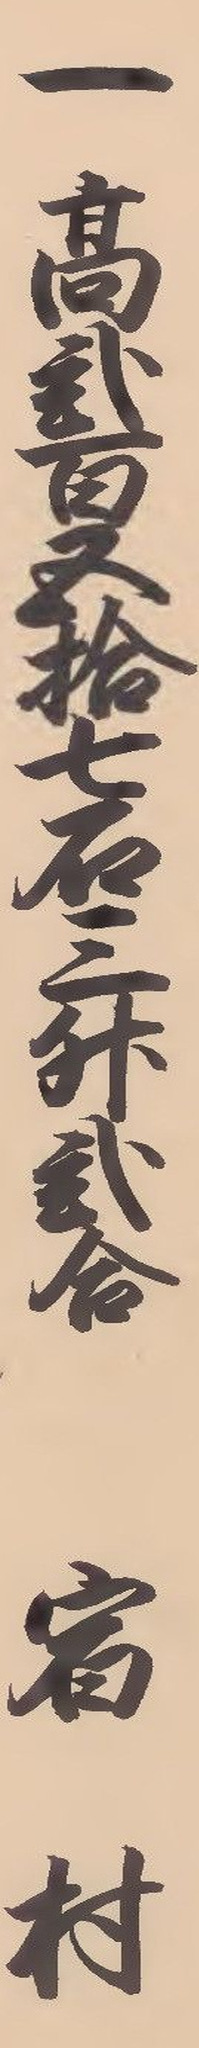一高弐百五拾七石三升弐合宿村
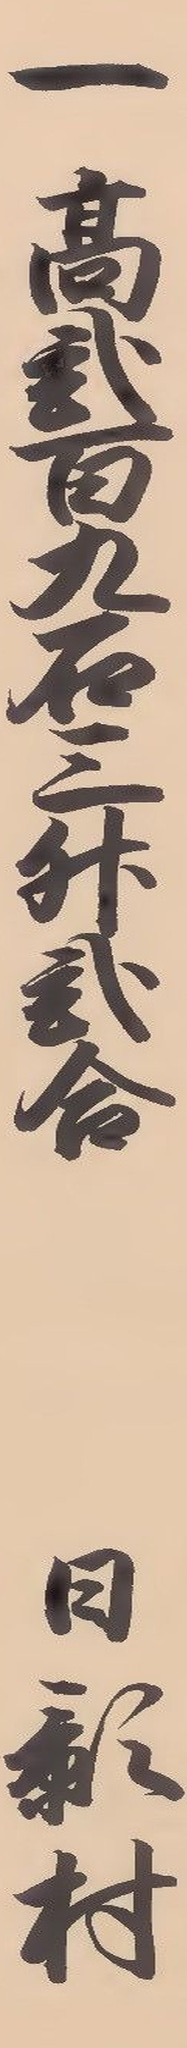一高弐百九石三升弐合日影村
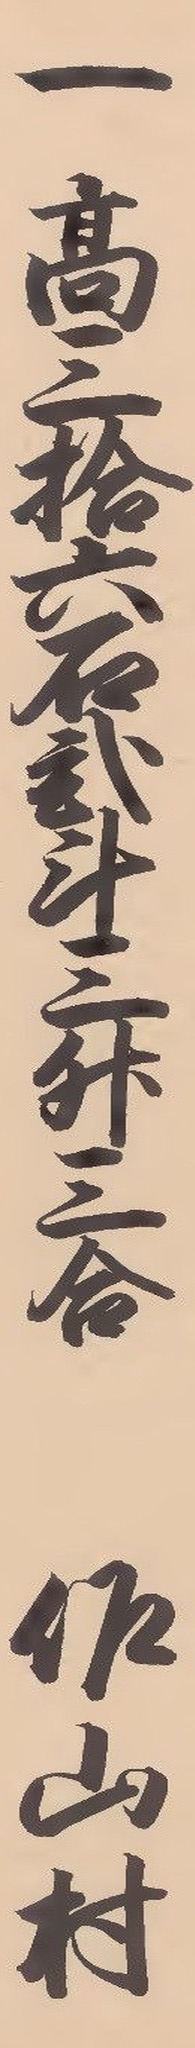一高三拾六石弐斗三升三合作山村
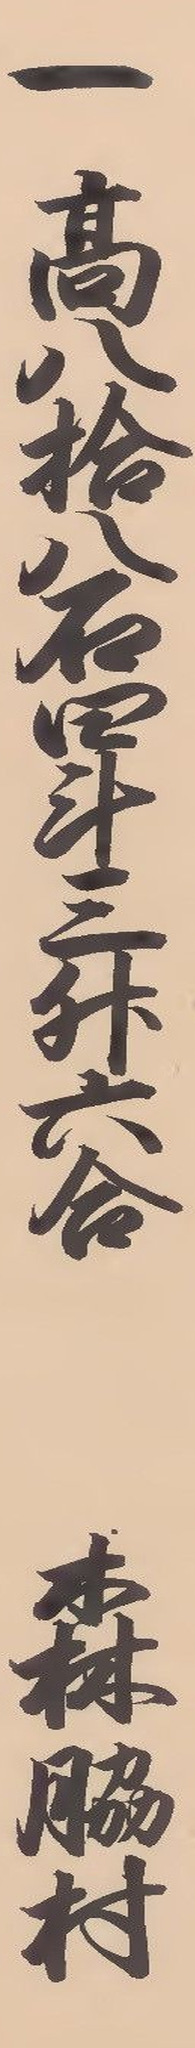一高八拾八石四斗三升六合森脇村
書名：但馬国郷帳
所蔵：国立公文書館 National Archives of Japan
